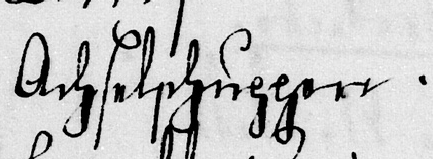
Achselschuppen
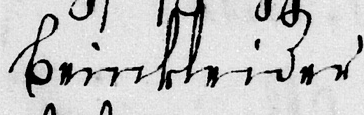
Beinkleider
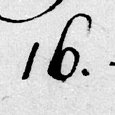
160.
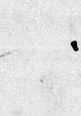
R.
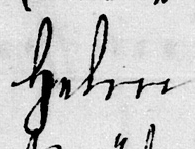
Helm
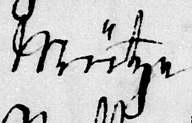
Mütze
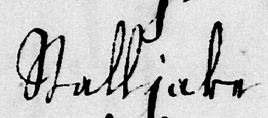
Stalljake
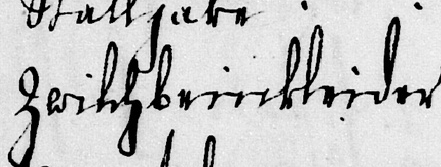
Zwilchbeinkleider
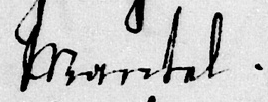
Mantel
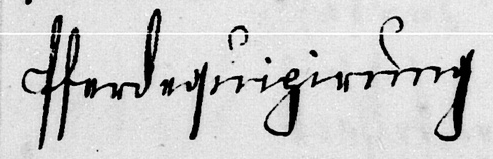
Pferdequipirung
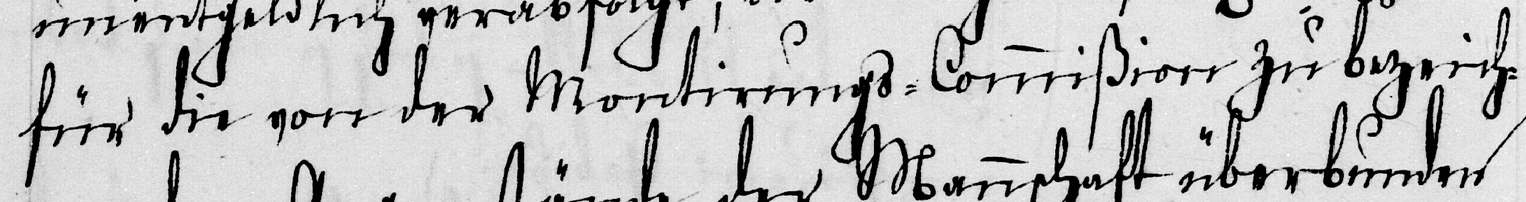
für die von der Montirungs-Commißion zu bezeich¬
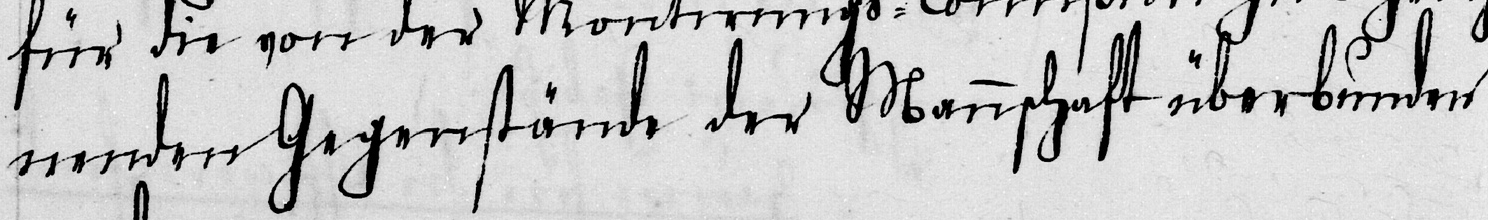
nenden Gegenstände der Mannschaft überbunden
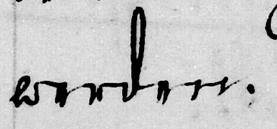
werden.
